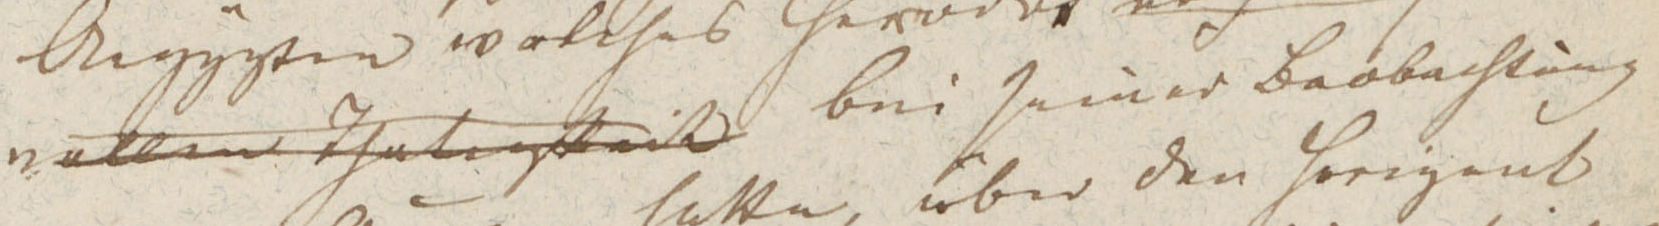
vollen Thatigkeit bei seiner Beobachtung
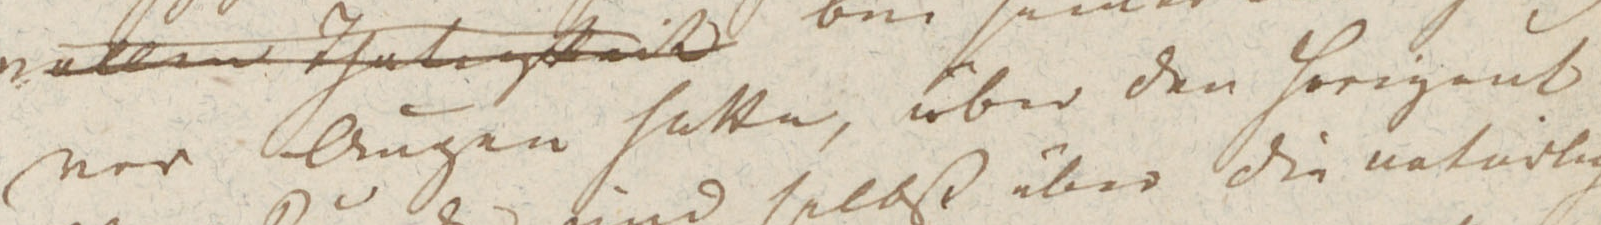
vor Augen hatte, über den Horizont
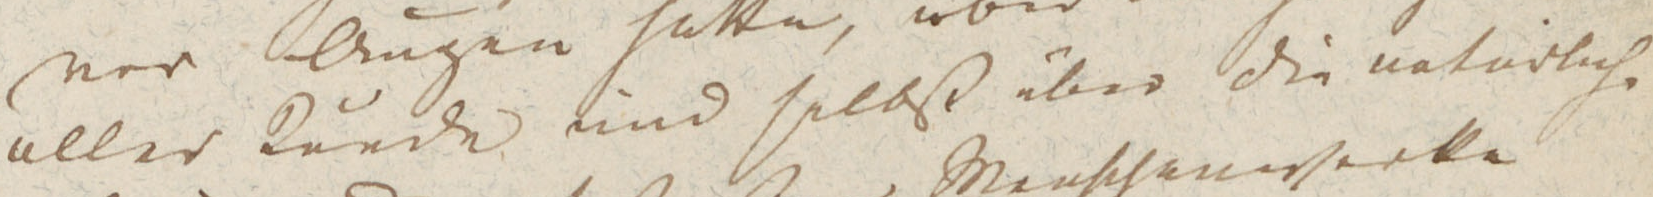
aller Kunde und selbst über die natürliche
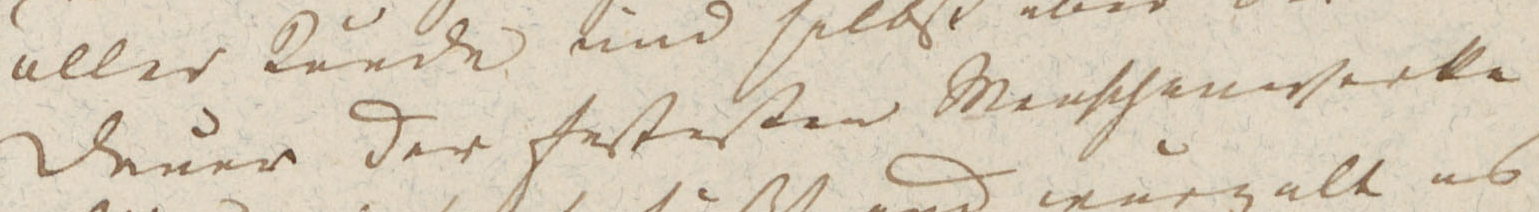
Dauer der festesten Menschenwerke
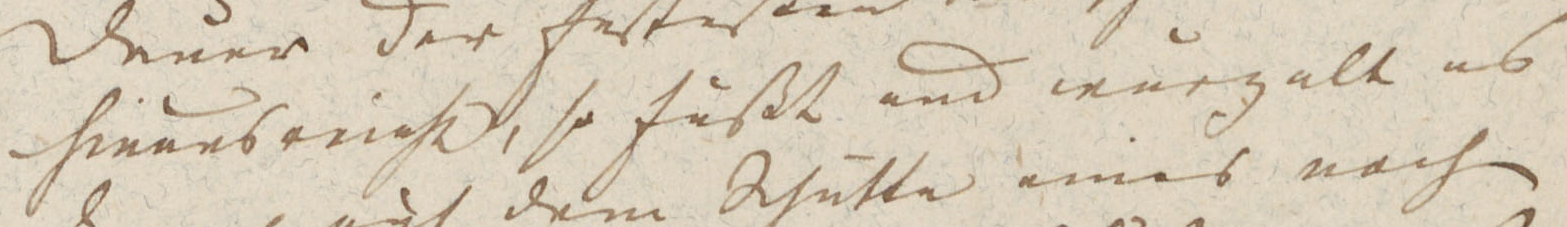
hinausreicht, so fusst und wurzelt es
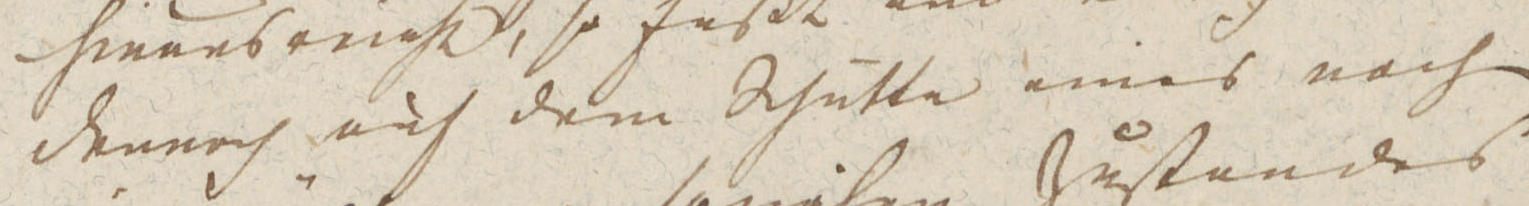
dennoch auf dem Schutte eines noch
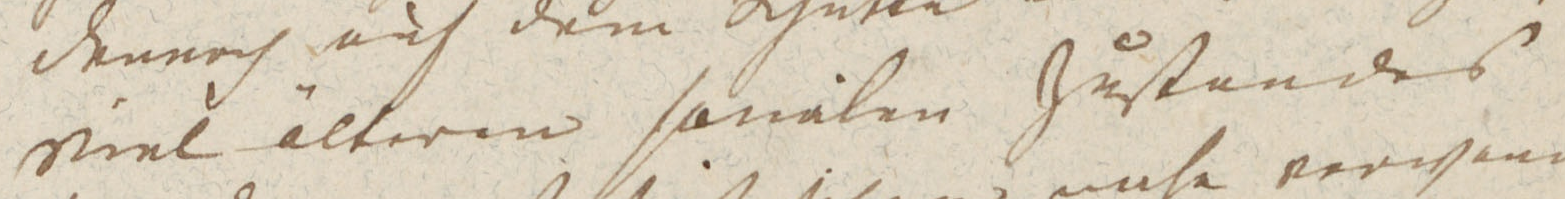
viel älteren socialen Zustandes
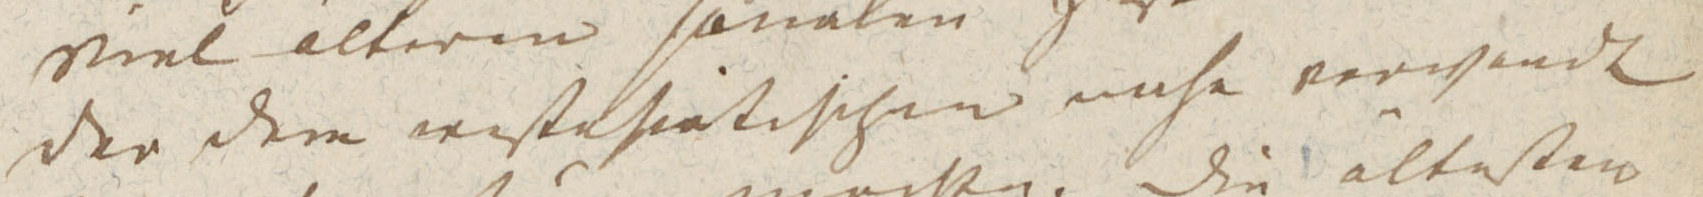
der dem westasiatischen nahe verwandt
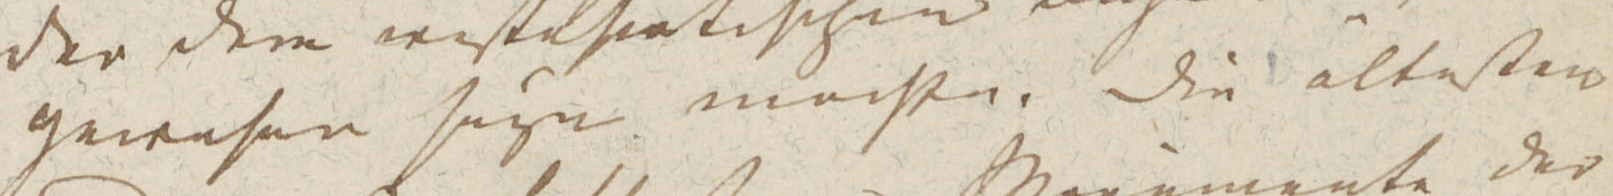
gewesen seyn mochte. Die ältesten
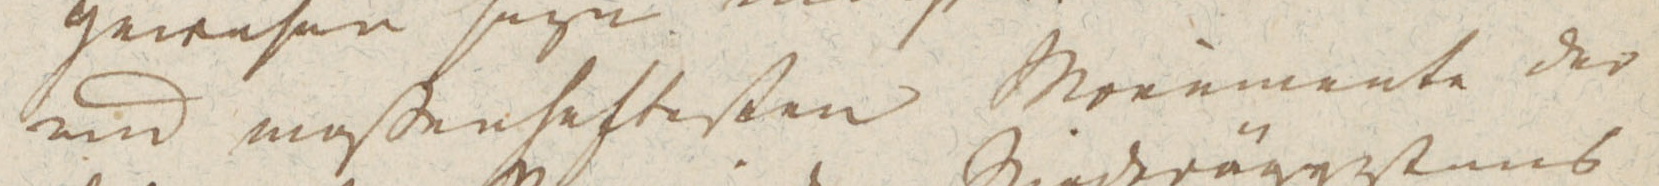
und massenhaftesten Monumente der
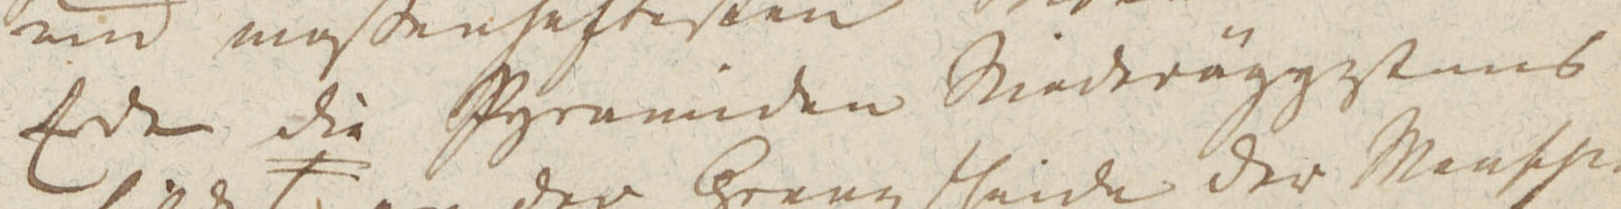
Erde die Pyramiden Niederägyptens
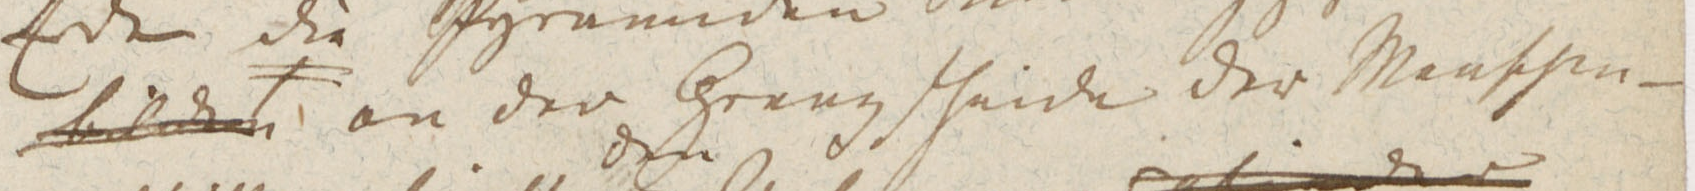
bilden % an der Grenzscheide der Menschen-
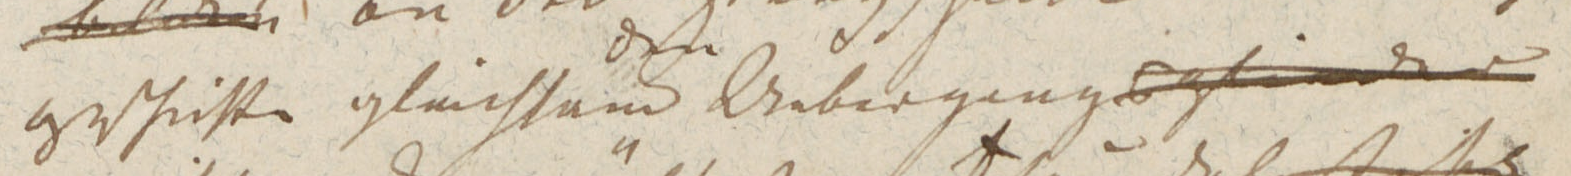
geschichte gleichsam den Uebergangsglieder
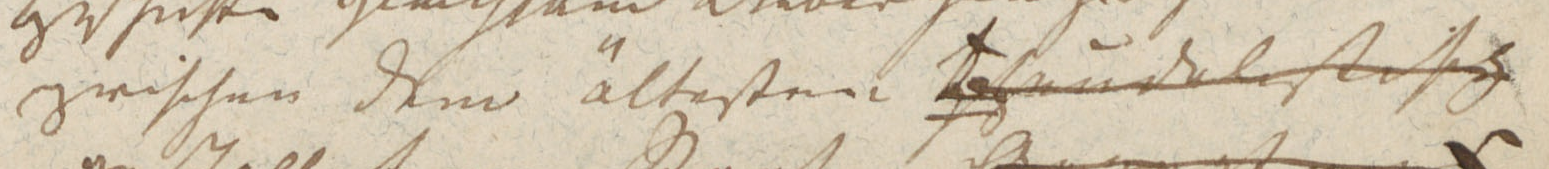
zwischen dem ältesten phfeudalistisch
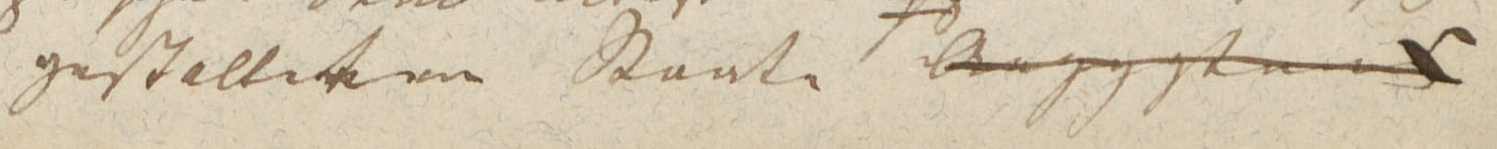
gestaltenten Staate Aegyptens
